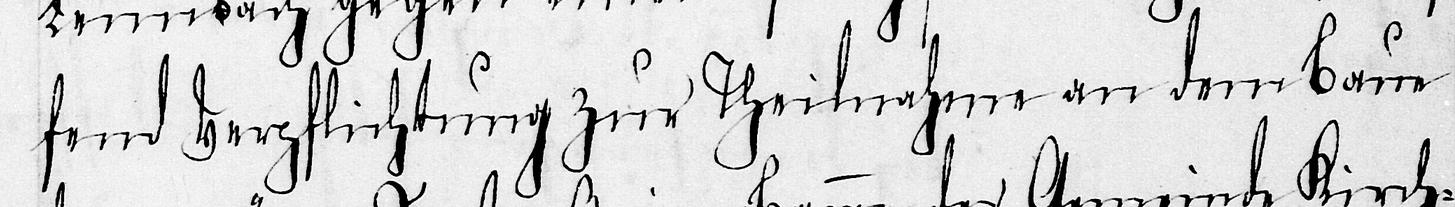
fend Verpflichtung zur Theilnahme an dem Baue
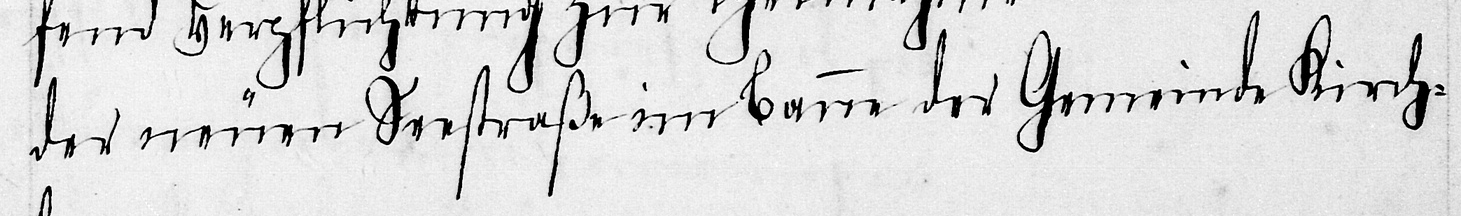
der neuen Seestraße im Banne der Gemeinde Kirch¬
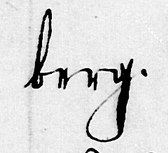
berg.
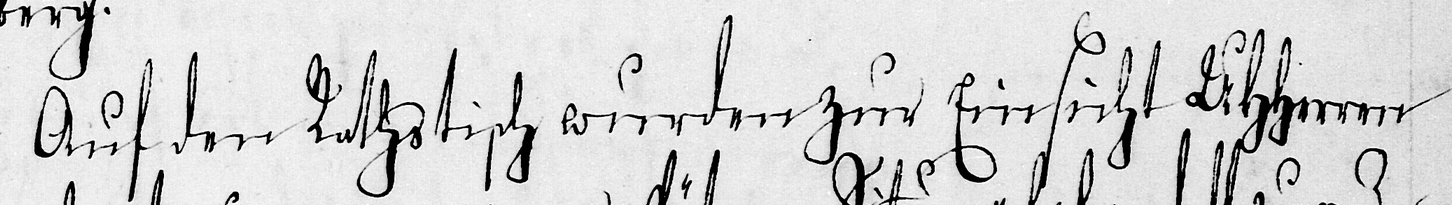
Auf den Rathstisch wurden zur Einsicht UHHerren
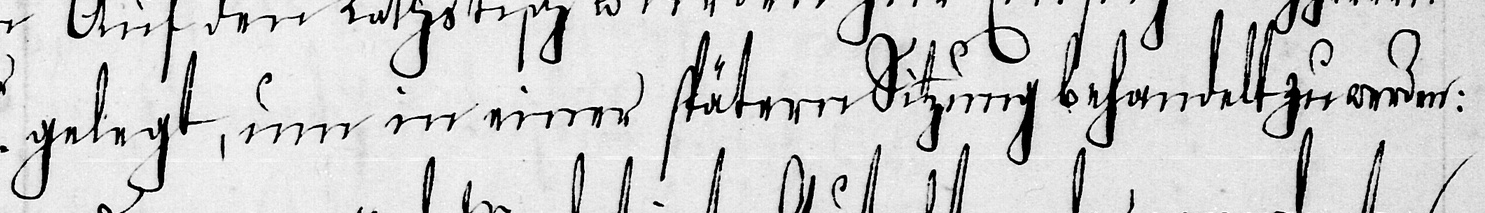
gelegt, um in einer spätern Sitzung behandelt zu werden:
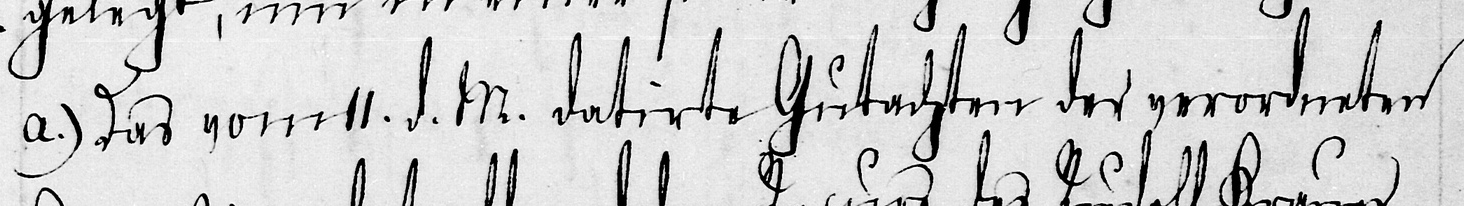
a.) Das vom 11. d. M. datirte Gutachten der verordneten
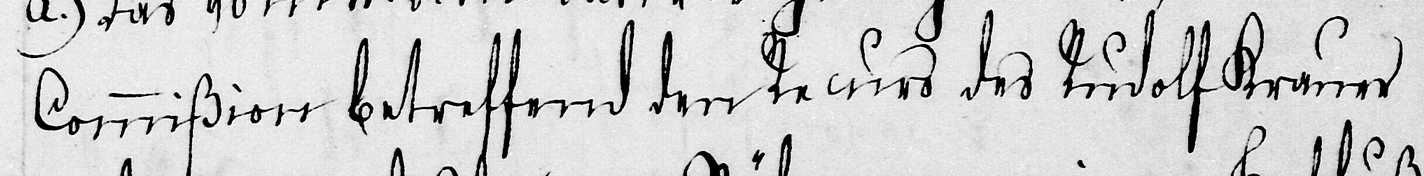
Commißion betreffend den Recurs des Rudolf Krauer
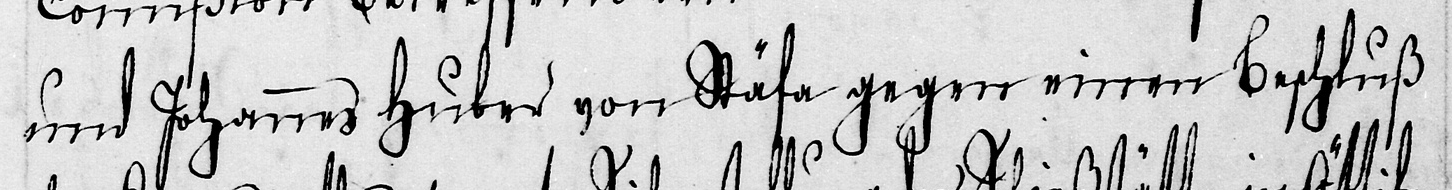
und Johannes Huber von Stäfa gegen einen Beschluß
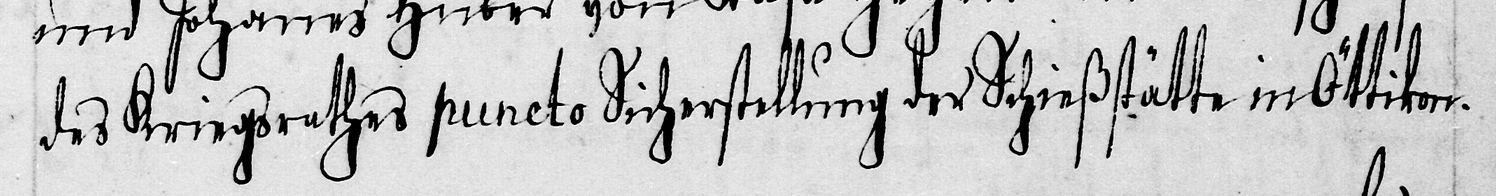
des Kriegsrathes puncto Sicherstellung der Schießstätte in
